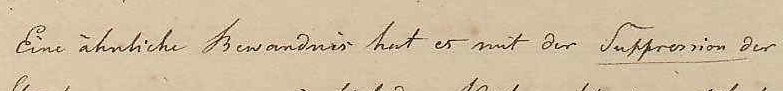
Eine ähnliche Bewandnis hat es mit der Suppression der
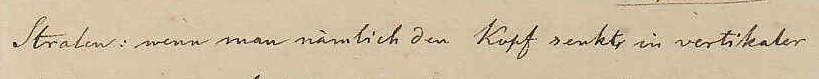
Stralen: wenn man nämlich den Kopf senkt, in vertikaler
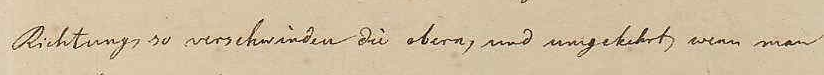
Richtung, so verschwinden die obern, und umgekehrt, wenn man
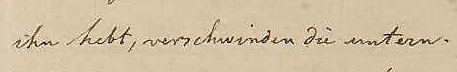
ihn hebt, verschwinden die untern.
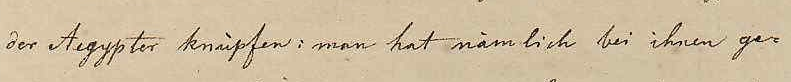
der Aegypter knüpfen: man hat nämlich bei ihnen ge-
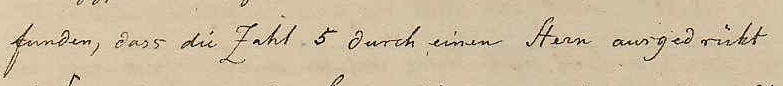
funden, dass die Zahl 5 durch einen Stern ausgedrückt
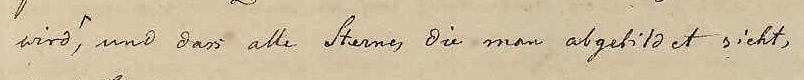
wird, und dass alle Sterne, die man abgebildet sieht,
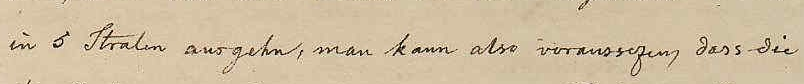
in 5 Stralen ausgehn, man kann also voraussezen, dass die
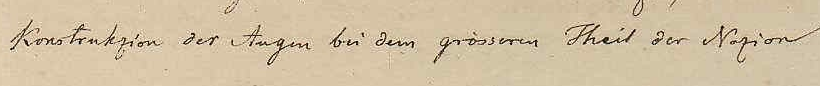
Konstrukzion der Augen bei dem grösseren Theil der Nazion
